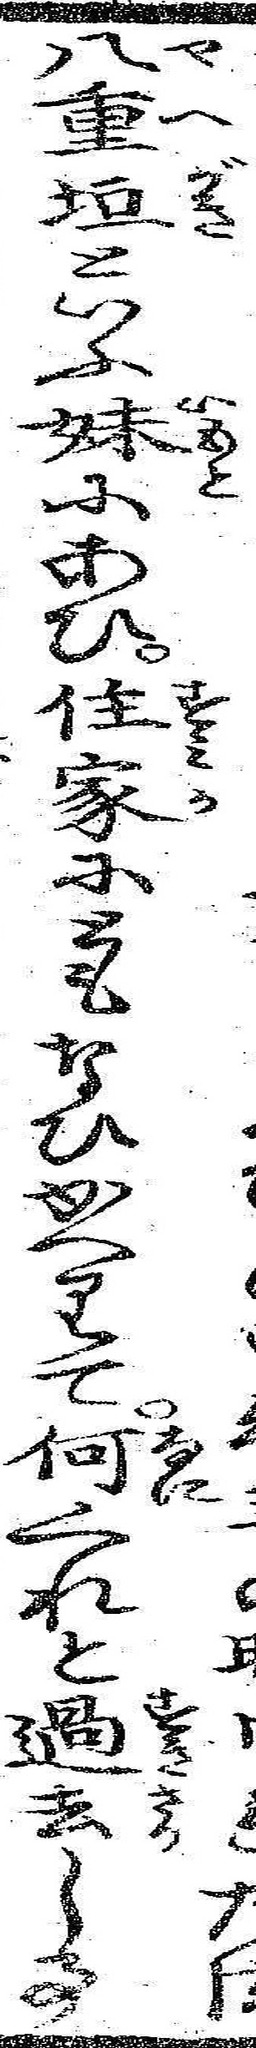八重垣といふ妹にあひ。住家にともなひかへりて。何くれと過去し事
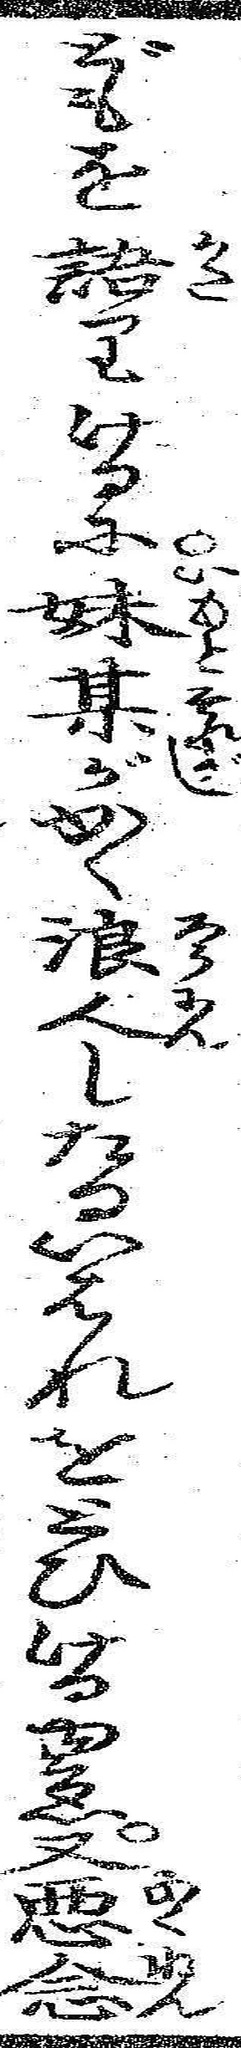どもを語りけるに。妹某がかく浪人したるいはれをとひけるゆゑ。又悪念
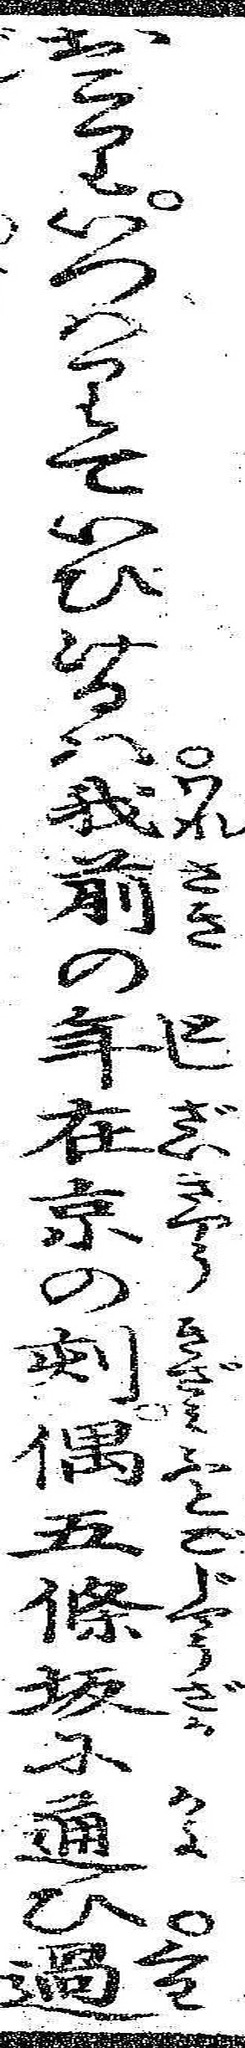おこり。いつはりていひけるは。我前の年在京の刻。偶五条坂に通ひ。過
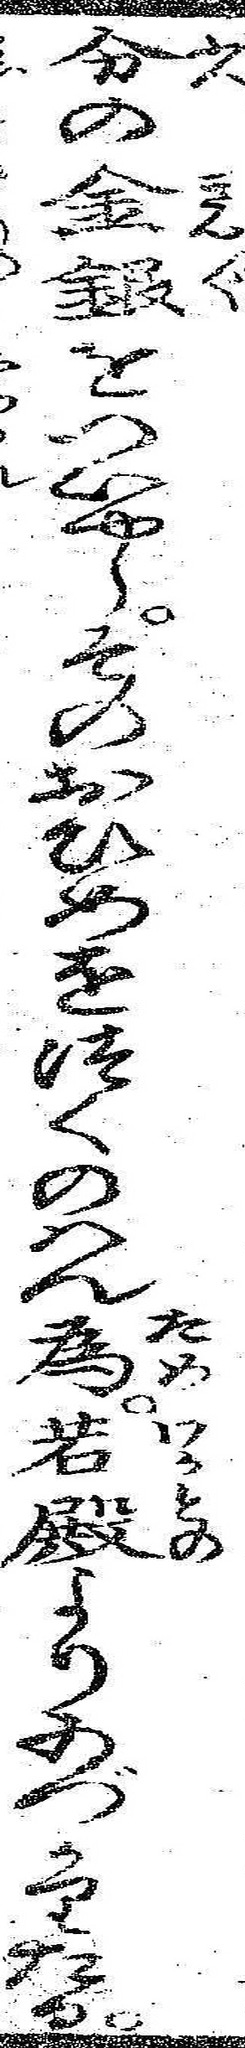分の金銀をついやし。そのおひめをつくのはん為。若殿よりあづかりたる。
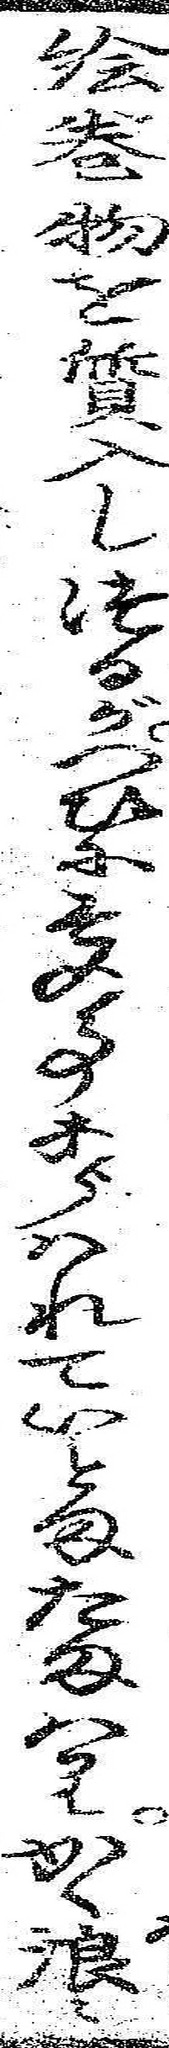絵巻物を質入しつるが。つひにその事あらはれていとまたまはり。かく浪々
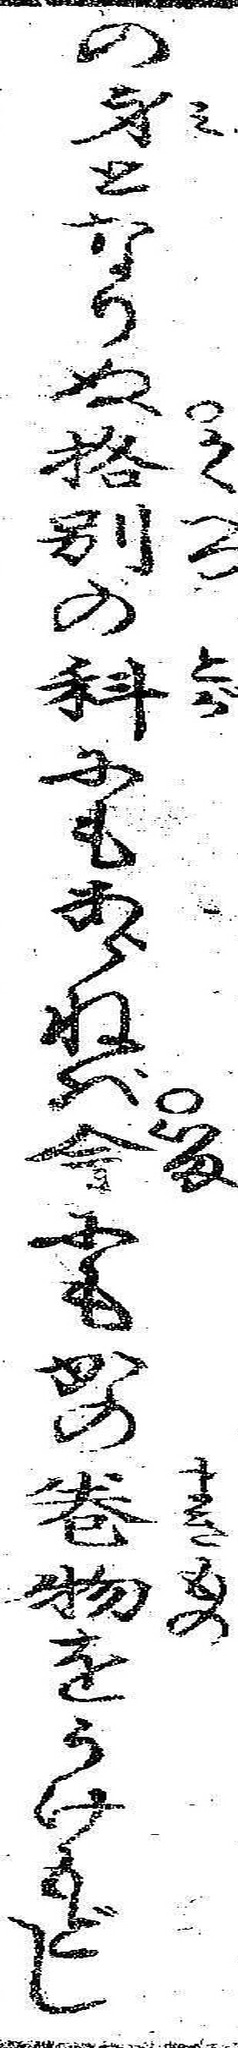の身となりぬ。格別の科にもあらねば。今にもかの巻物をうけもどし

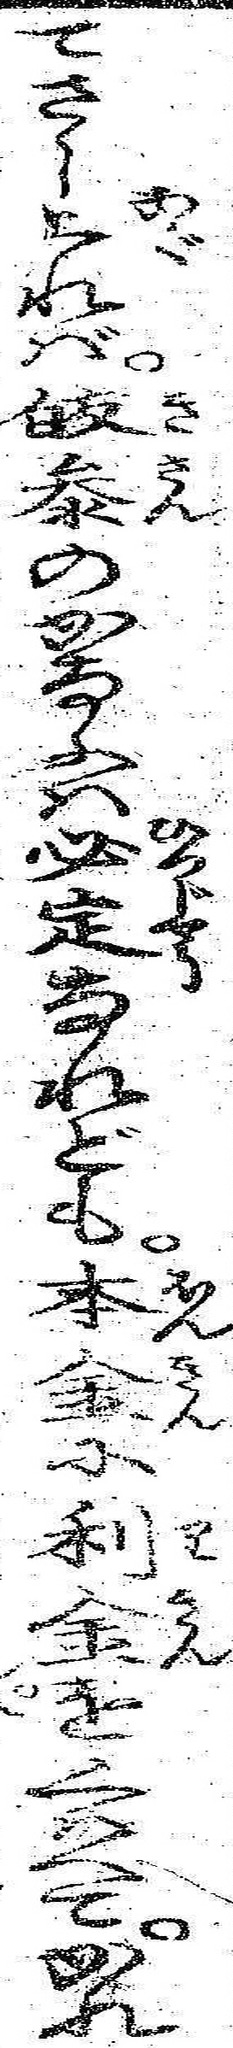てさし上れば。帰参のかなふは必定なれども。本金に利金をくはへて。かれ
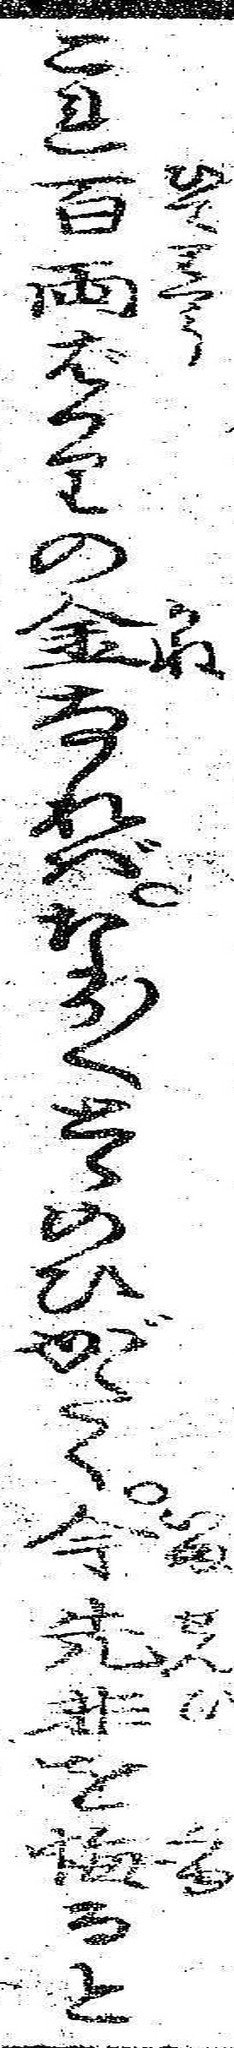これ百両ばかりの金なれば。なか〳〵とゝのひがたく。今先非を悔ると
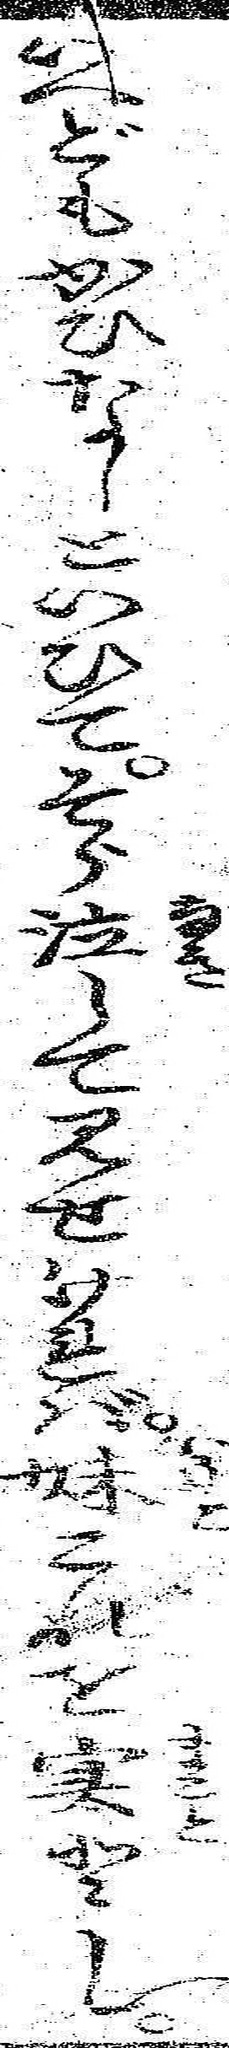いへどもかひなしといひて。そら泣して見せければ。妹これを実とし。
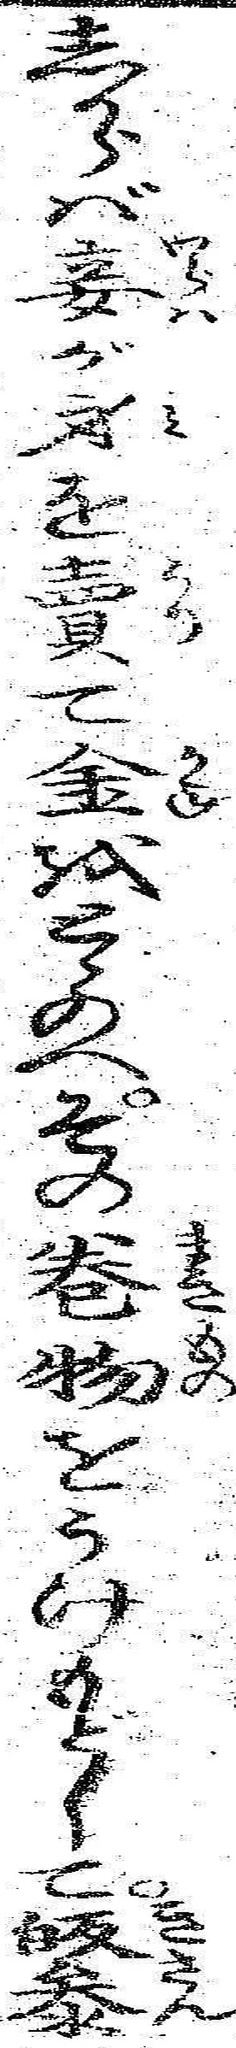しからば妾が身を売て金をとゝのへ。その巻物をうけもどして。帰参
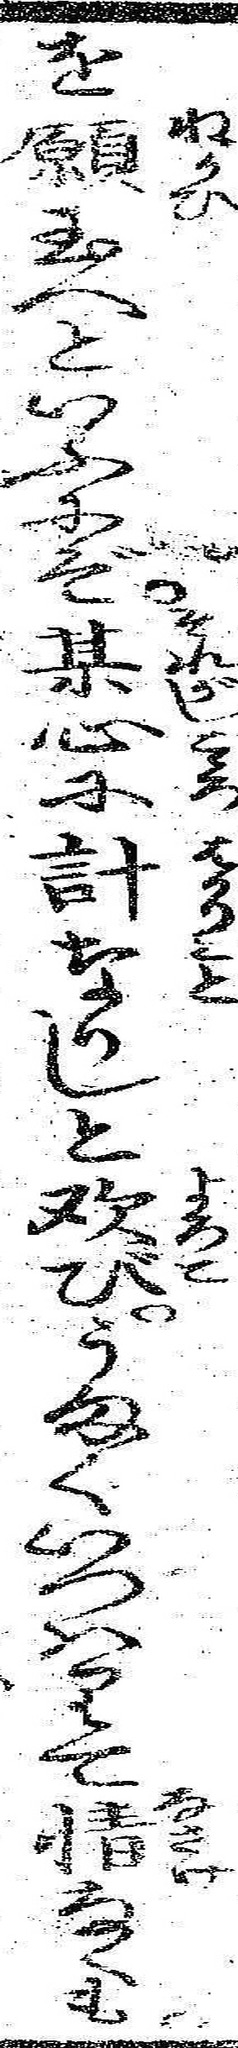を願玉へといふにぞ。某心に計なりしと歓び。うまくいつはりて情なくも。
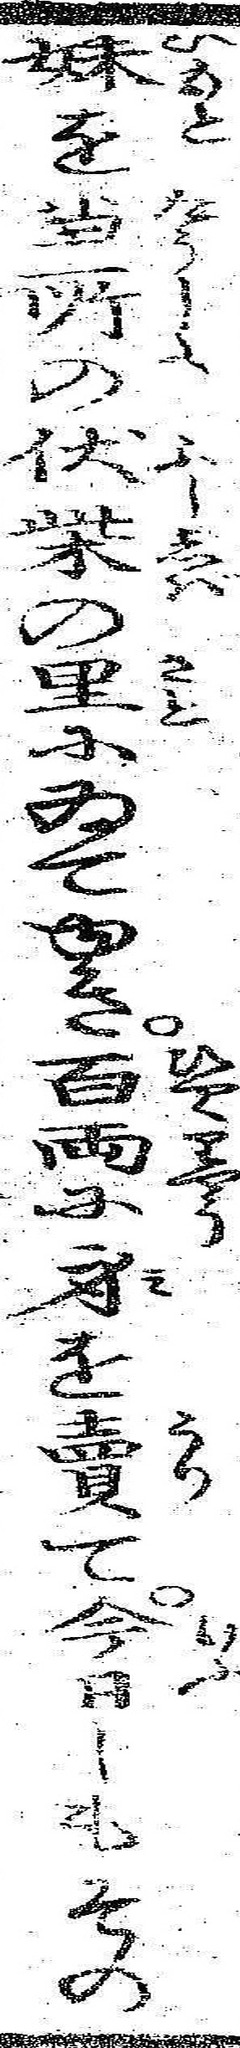妹を当所の伏柴の里にゐてゆき。百両に身を売て。今日しもその
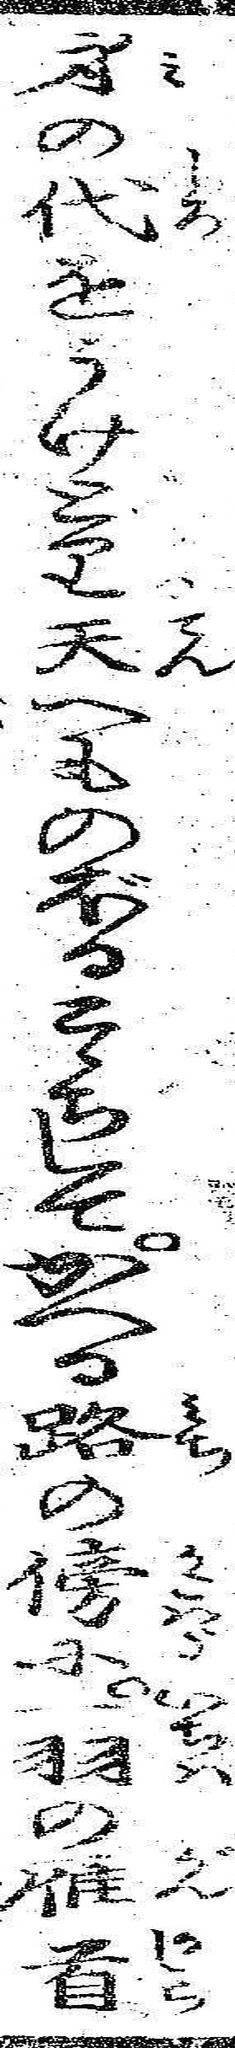身の代をうけとり。天へものぼるこゝちして。かへる路の傍に。一羽の雁首
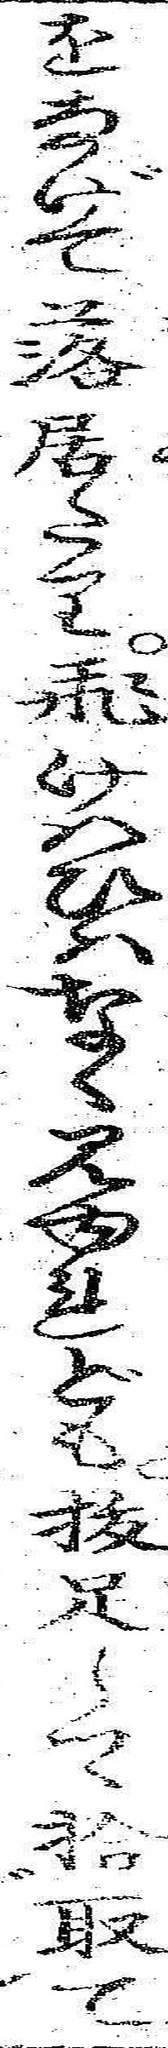をなげて落居たり。飛けはひはなく見ゆれども。抜足しつゝ拾取て
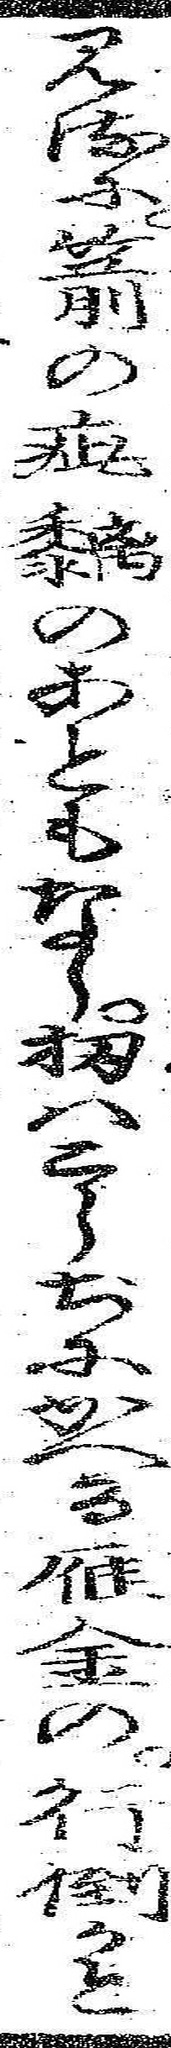見るに。箭の疵黐のあともなし。扨はこしぢにかへる雁金の。行倒かと
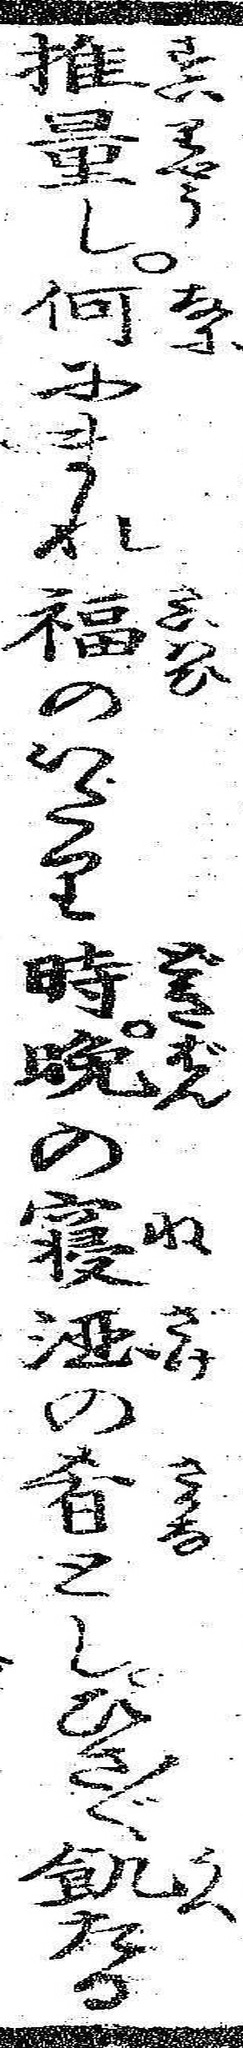推量し。何にまれ福のいたり時。晩の寝洒の肴とし。ひさ〴〵飢たる
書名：昔話稲妻表紙
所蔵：国文学研究資料館
